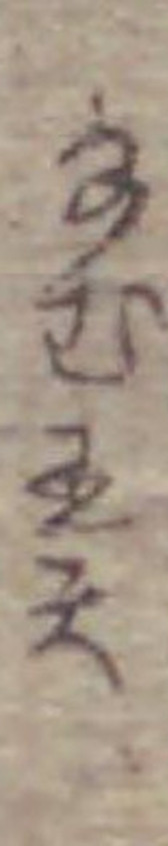なむ王天

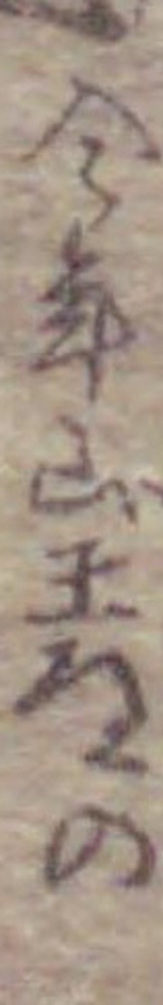今年山王様の

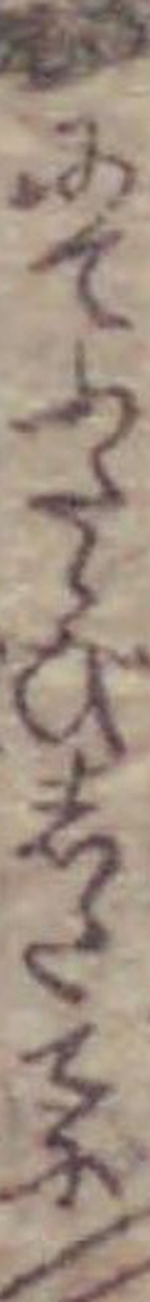にてふたゝびしたてに入り
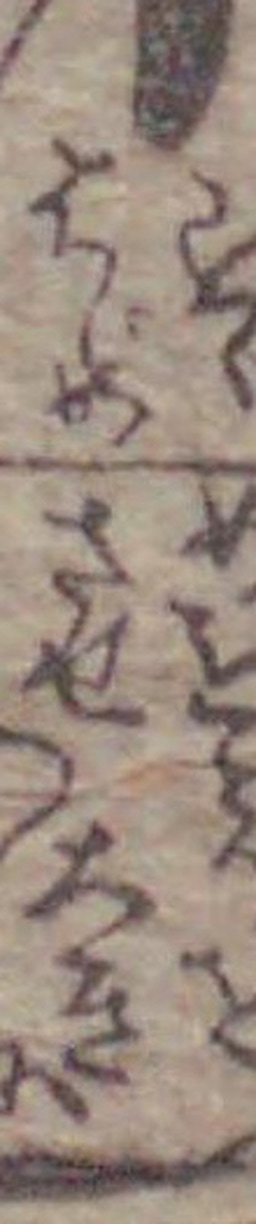はじめさせ大きに
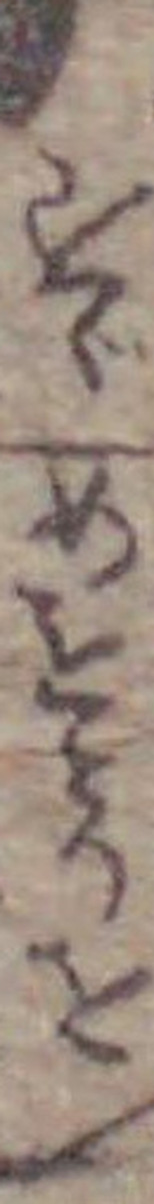すゞめをとりを
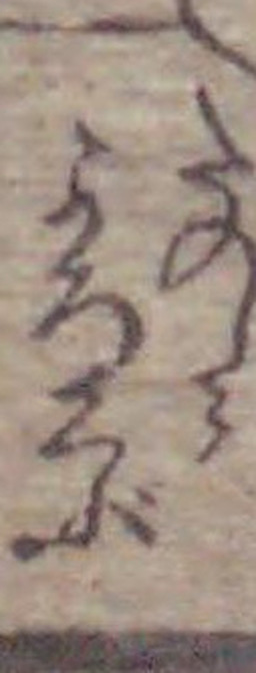よろこぶ
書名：嘘八百温故新知 : 2巻
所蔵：国立国会図書館 National Diet Library, JAPAN
